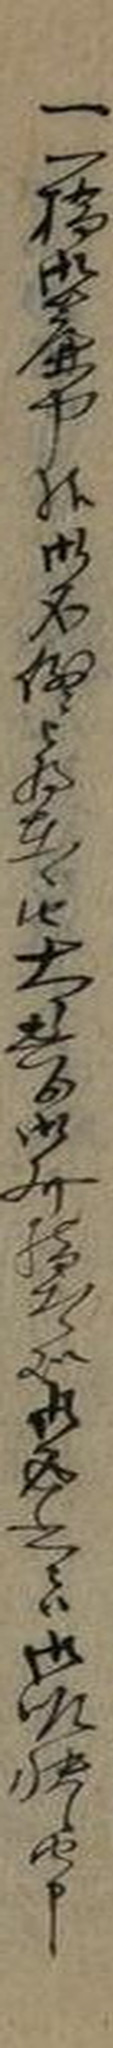一一橋御簾中様御不例ニ被為在候由大奥ゟ御文指出候処御返書ニハ御順快候由申
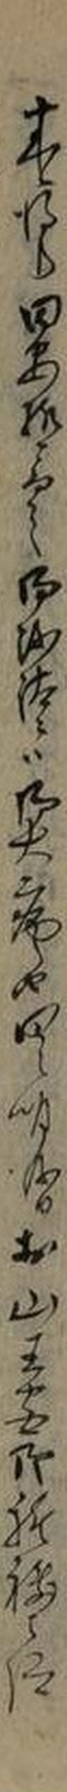来候得共田安様ニ而之御沙汰ニハ御大病候由仍之明後日於山王宮御祈祷被仰
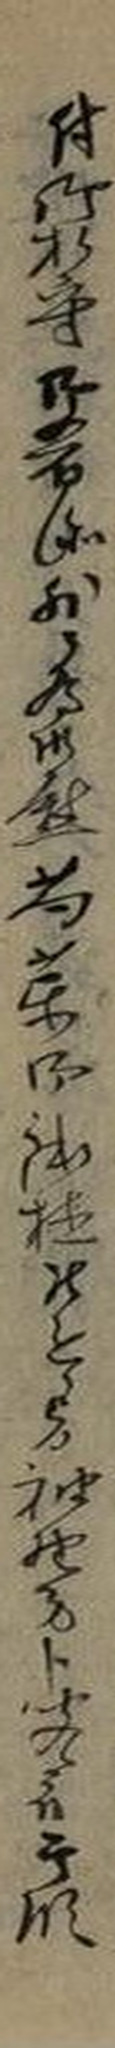付御札守御肴添外ニ為御慰芍薬御鉢植被進候旨袖野方申聞候ニ付其段
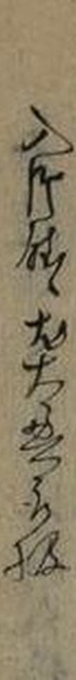入御聴候尤大奥取扱
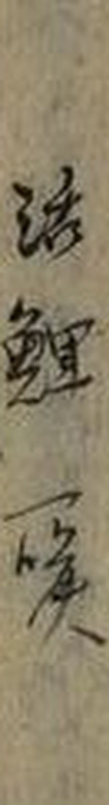活鯉一喉
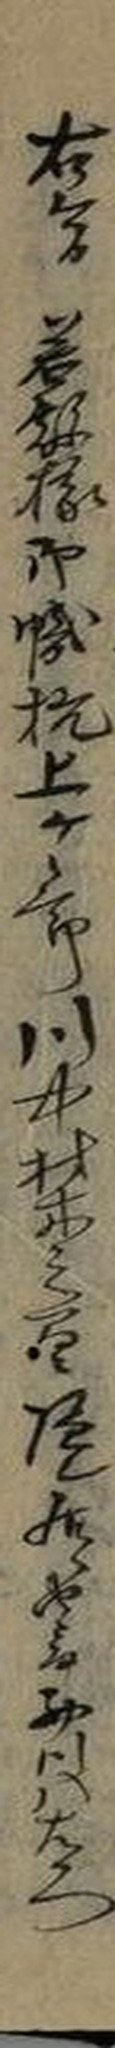右今日若殿様御幟杭上ヶ之節川中材木之間ニ隠レ居候由ニ而西川八左衛門
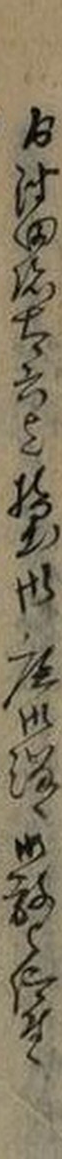ゟ津田弥太六迄指出御庭溜へ御放被仰付候
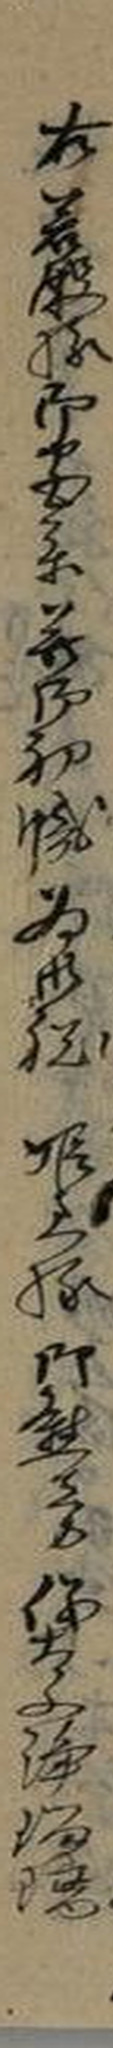右若殿様御宮参并御初幟為御祝姫君様御慰旁儀太夫浄瑠璃
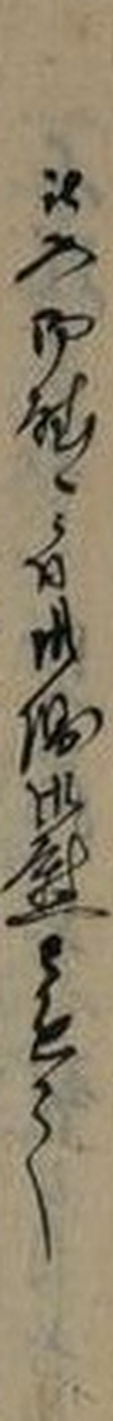被入御聴候ニ付御側御慰被進之
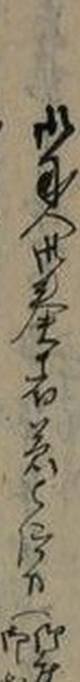御用人御奏者兼被仰付
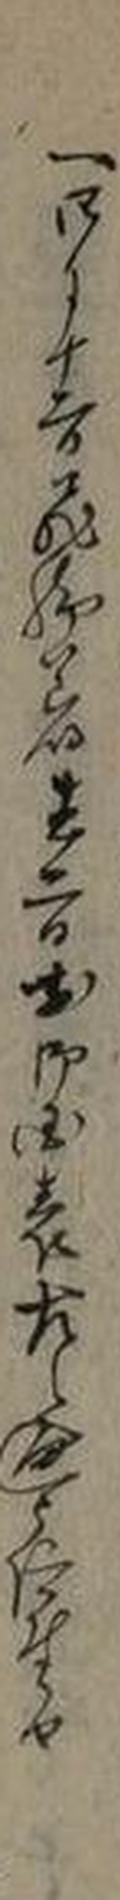一四月十二日飛脚着去二日出御国表左之通被仰付候由
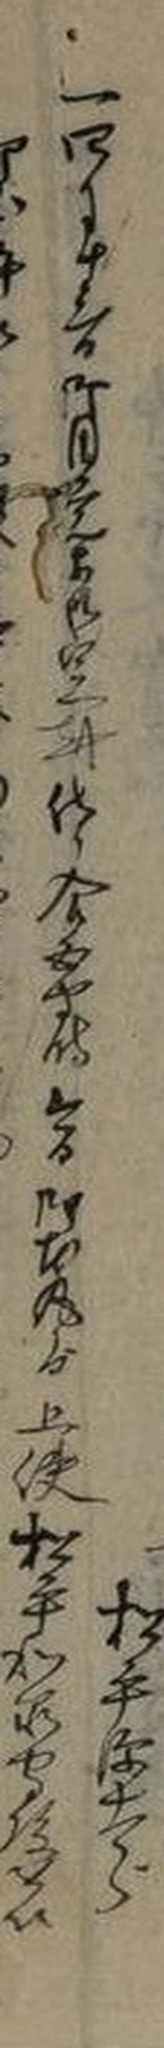一四月十三日御御目覚前御定刻代り合五半時今日御本丸ゟ上使松平和泉守殿を以
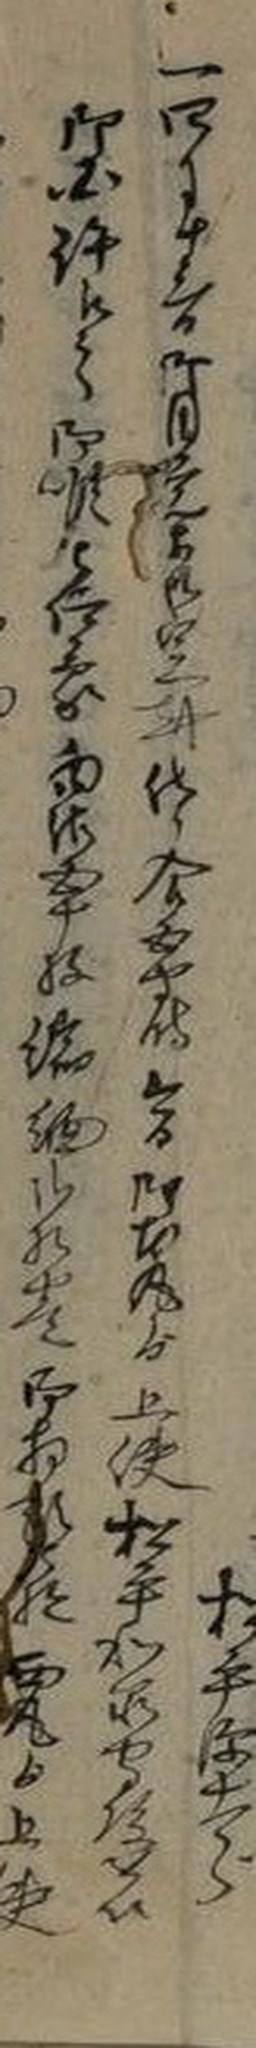御国許江之御暇被仰蒙白銀五十枚縮緬弐拾巻御拝領被遊西丸ゟ上使
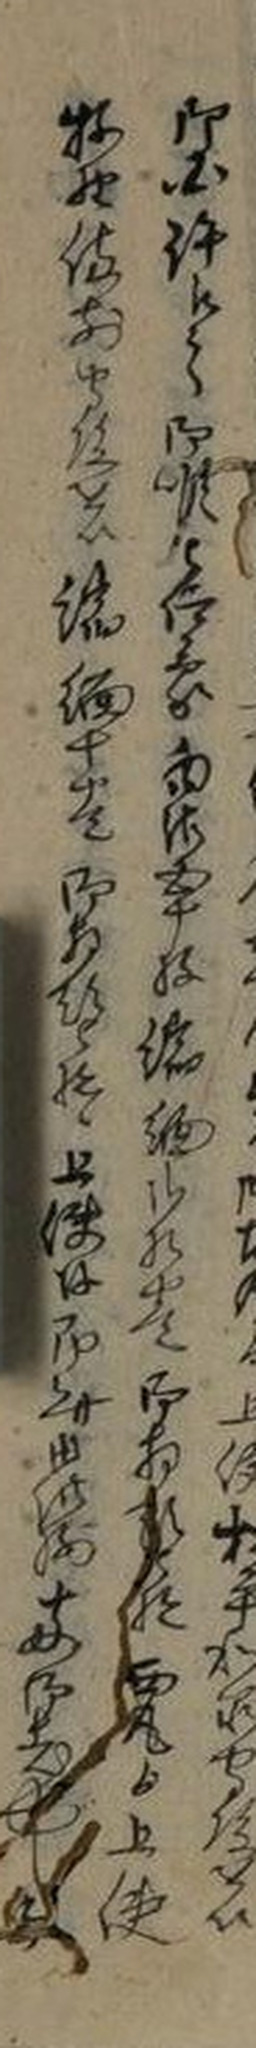牧野備前守殿を以縮緬十巻御拝領被遊候上使後即刻御供揃両御老中御

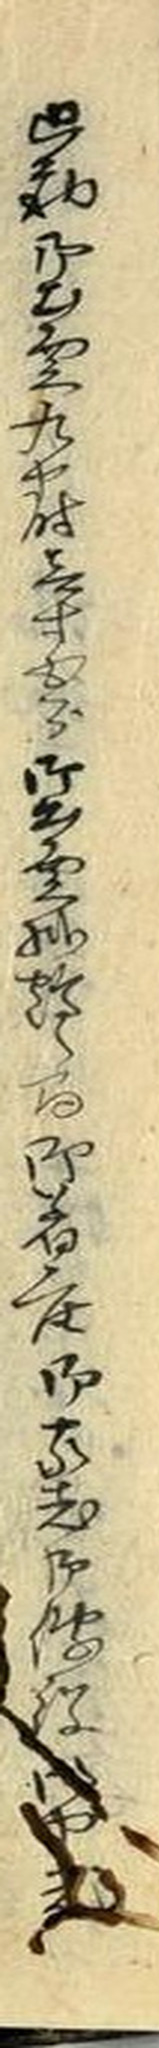廻勤御出殿九半時壱寸五分御出殿掛鶴之間御着座御家老御傅役御中老
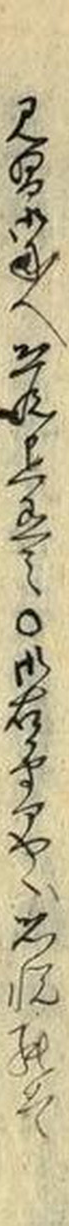見習御用人恐悦申上有之○御右筆部やへ恐悦罷出候
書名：少傅日録抄（斉承付側向頭取日記、在府）
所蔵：福井県文書館 Fukui Prefectural Archives
